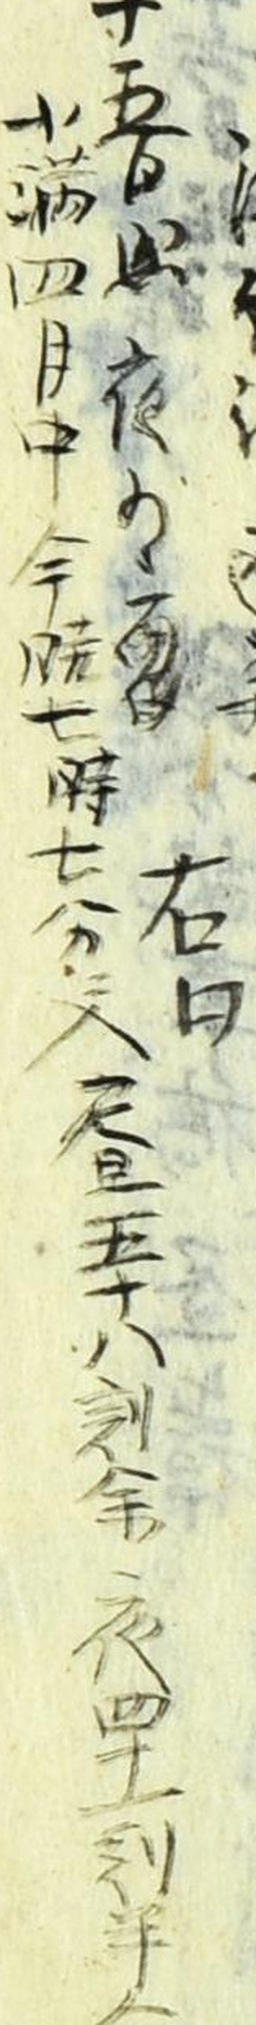小満四月中今暁七時七分ニ入昼五十八刻余夜四十一刻半余

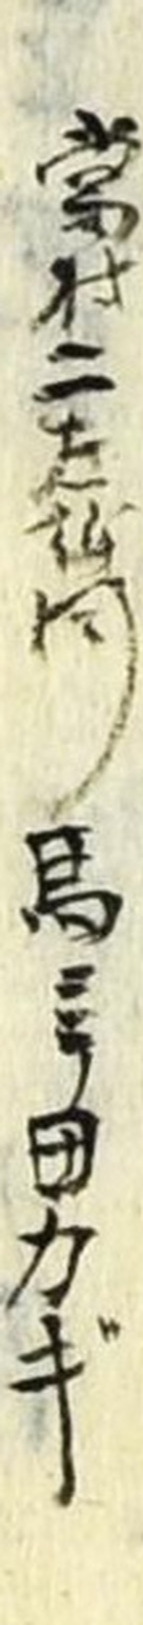当村二左衛門馬ニテ田カギ
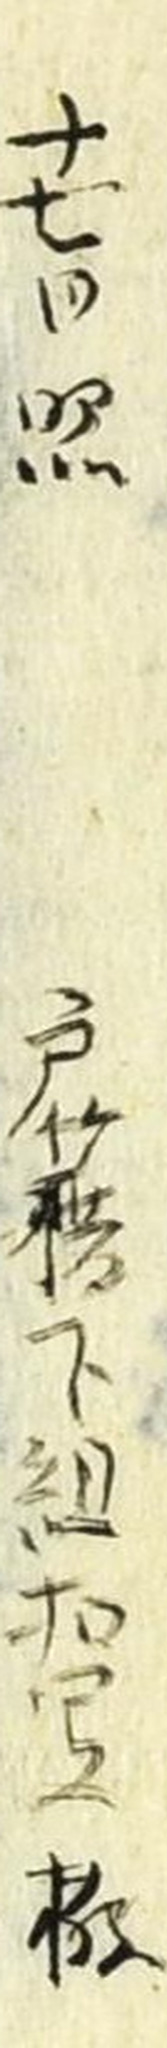十七日照戸籍下組控写拵
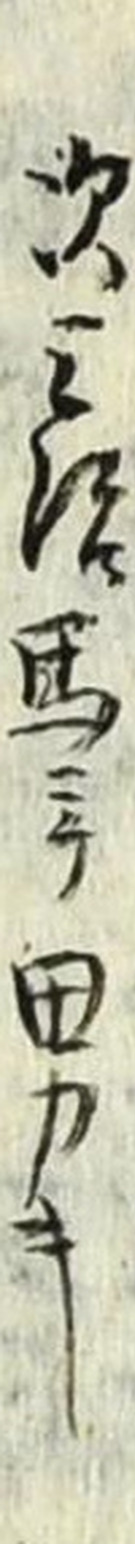次三治馬ニテ田カキ
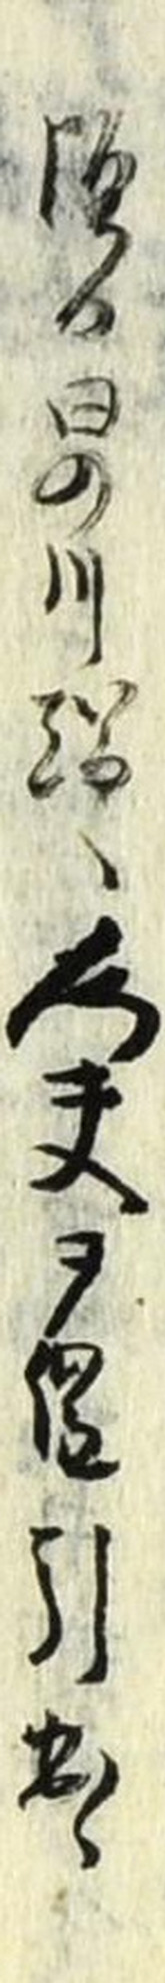頃日日の川端へ人夫ヲ催引出候
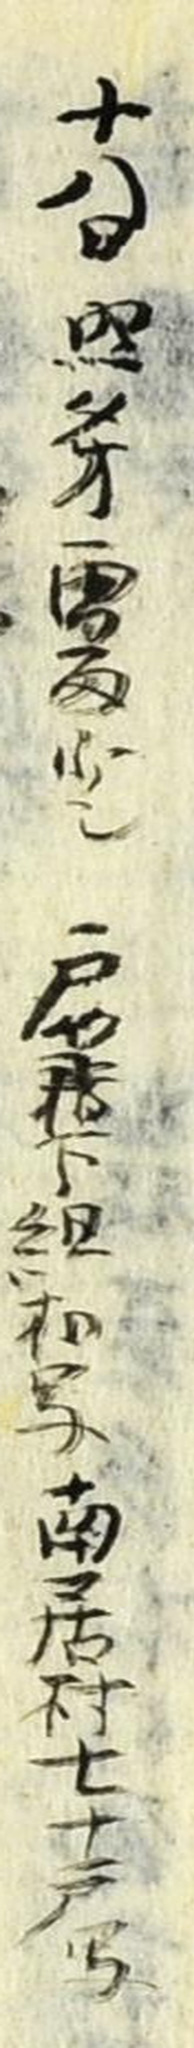十八日照夕方雷雨少シ戸籍下組扣写南居村七十戸写
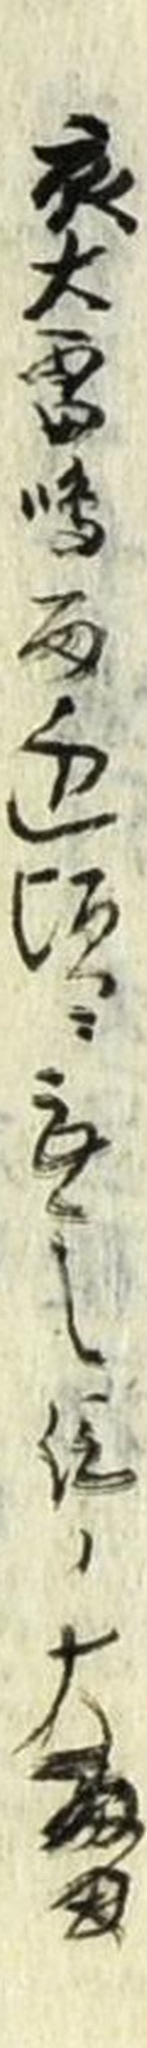夜大雷鳴雨近頃ニ無之位ノ大雷
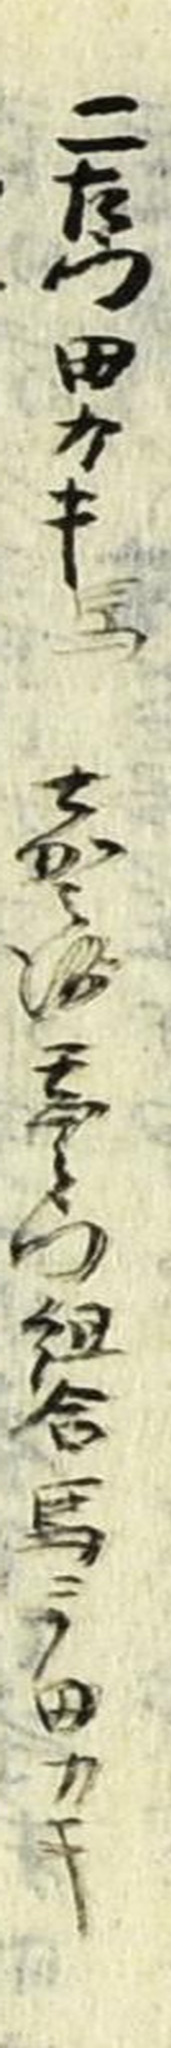二左衛門田カキ馬嘉兵衛甚右衛門組合馬ニテ田カキ
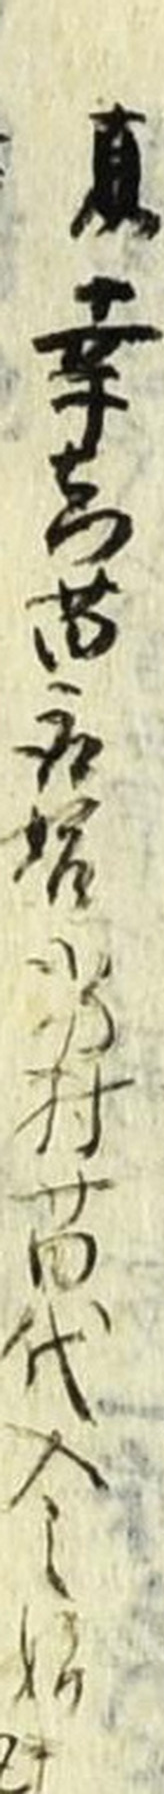幸右衛門苗取始当村苗代入之始也ナリ
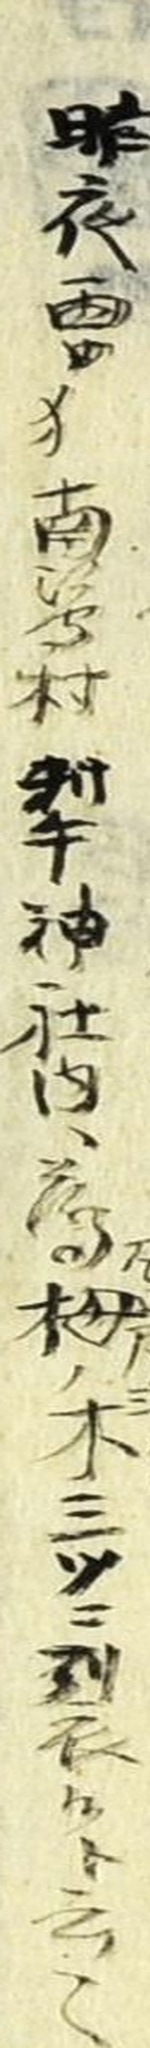昨夜雷犭南江守村犂神社内へ薄栂ノ木三ツニ裂候ト云々
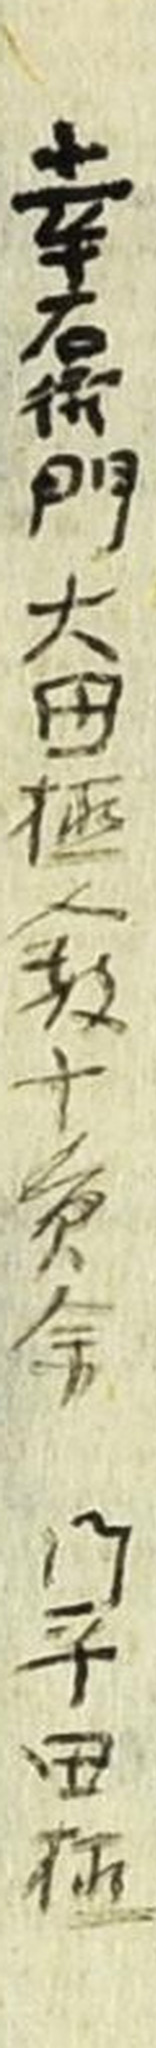幸右衛門大田植人数十員余門平田植
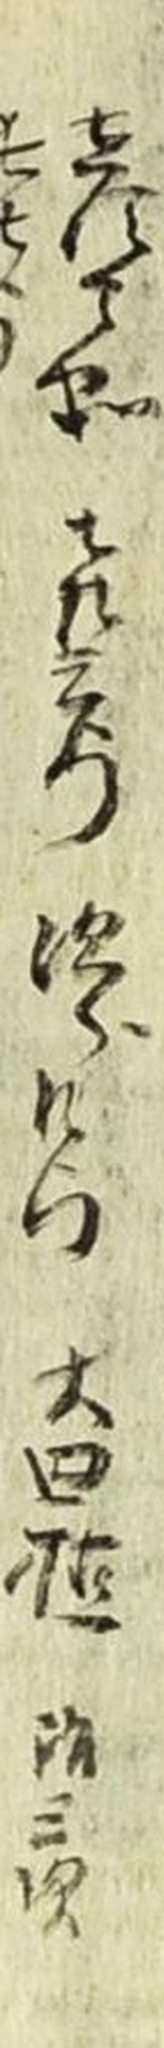彦兵衛彦三右衛門次郎左衛門大田植治三次
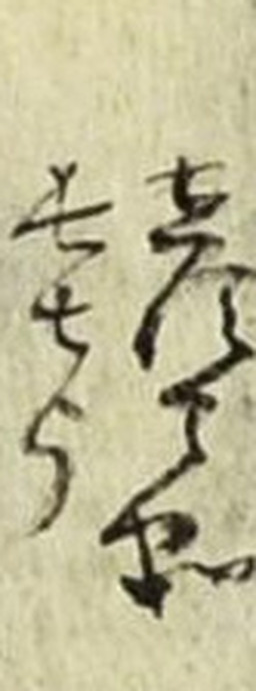長七郎
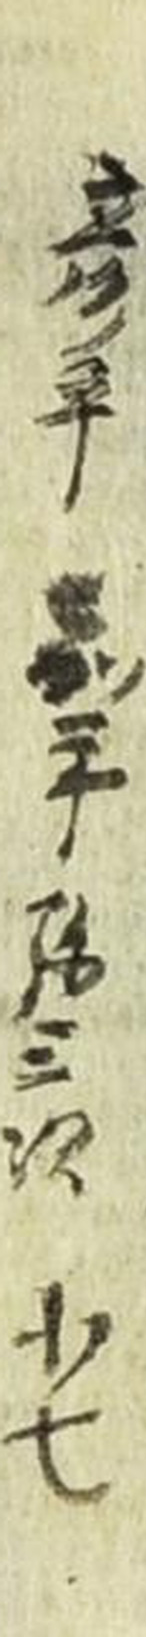彦平嘉平孫三次小七
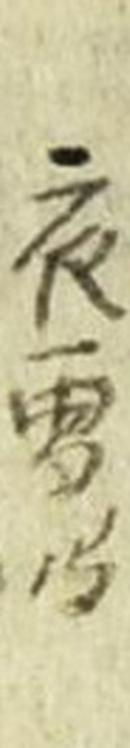夜雷鳴

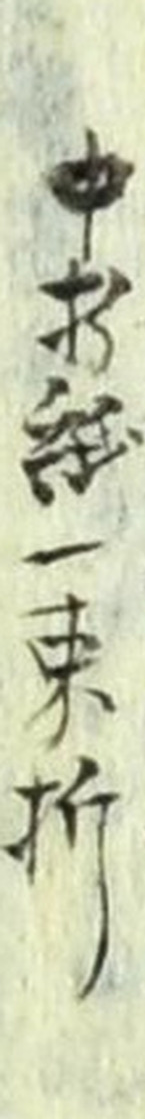中折紙一束折
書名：（日記）
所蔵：福井県文書館 Fukui Prefectural Archives
